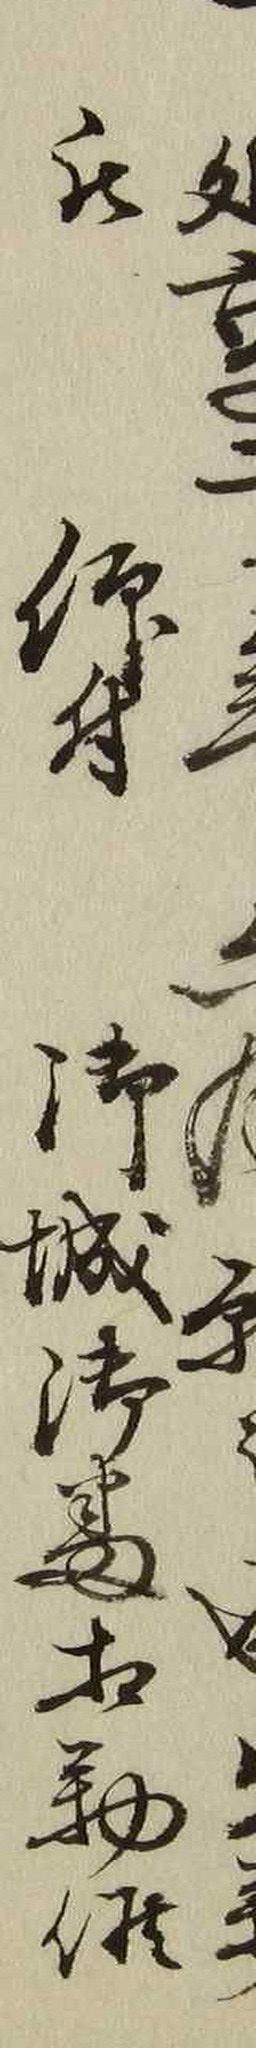被仰付御城御番相勤候
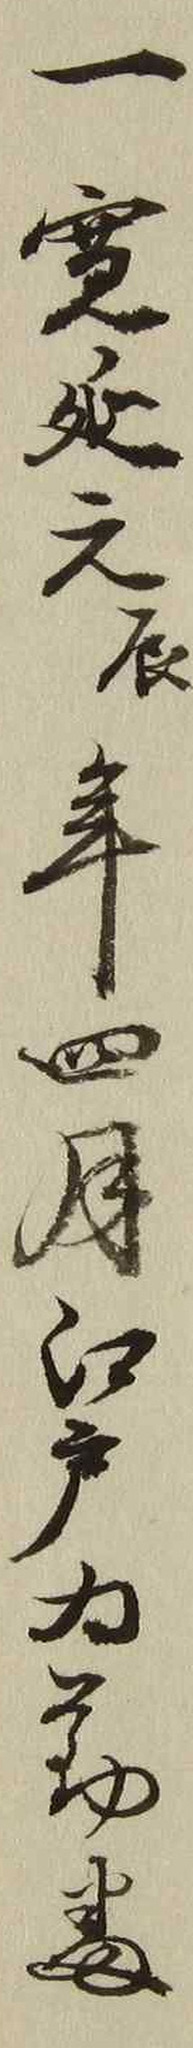一寛延元辰年四月江戸為勤番
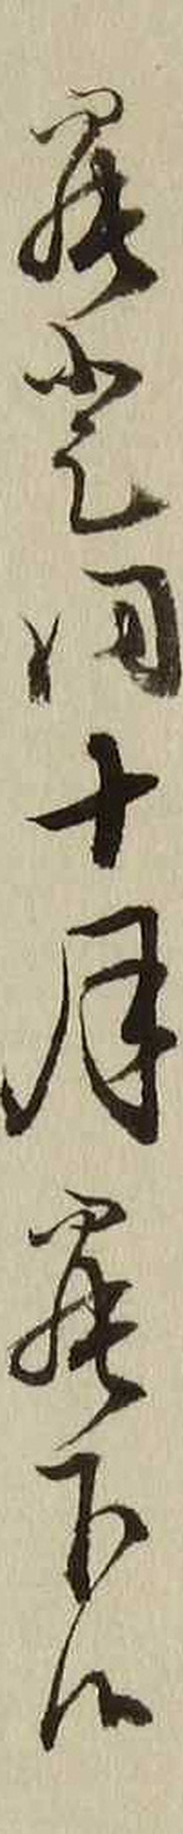罷登同十月罷下候
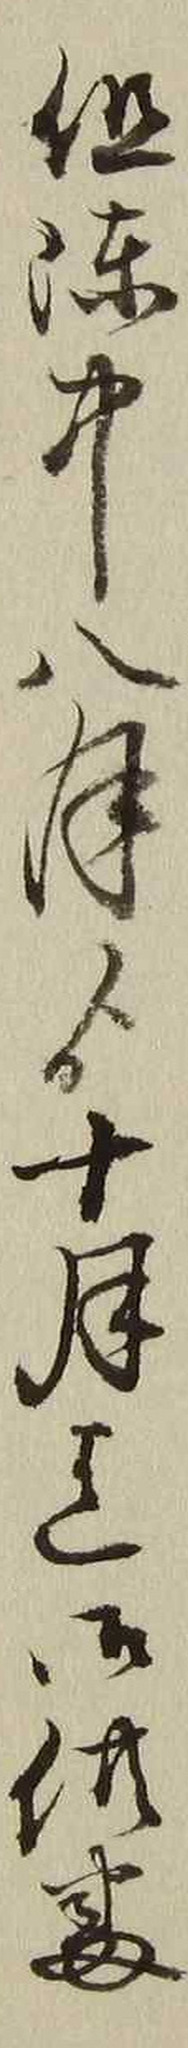但陳中八月ゟ十月迄御供番
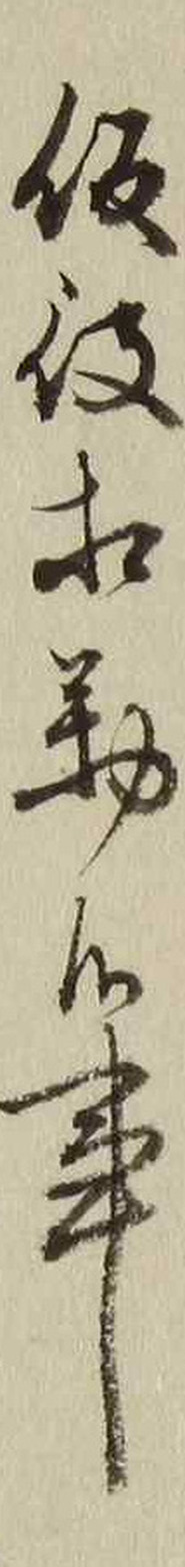仮役相勤候事
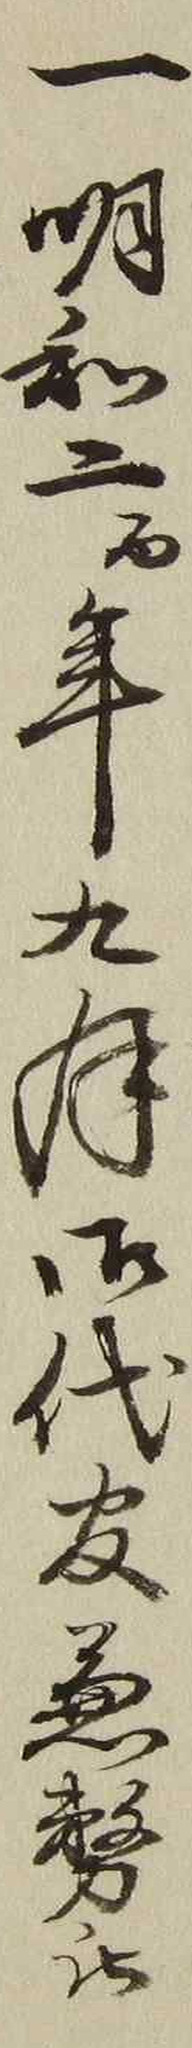一明和二酉年九月御代官兼務被
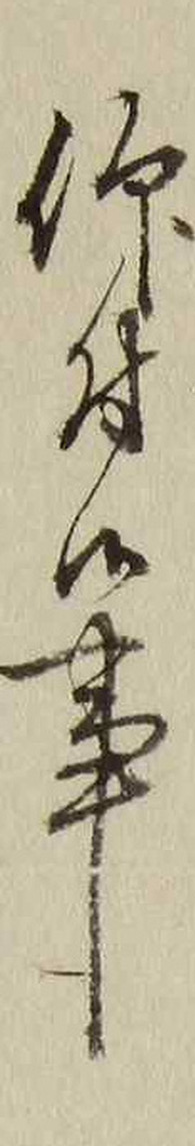仰付候事
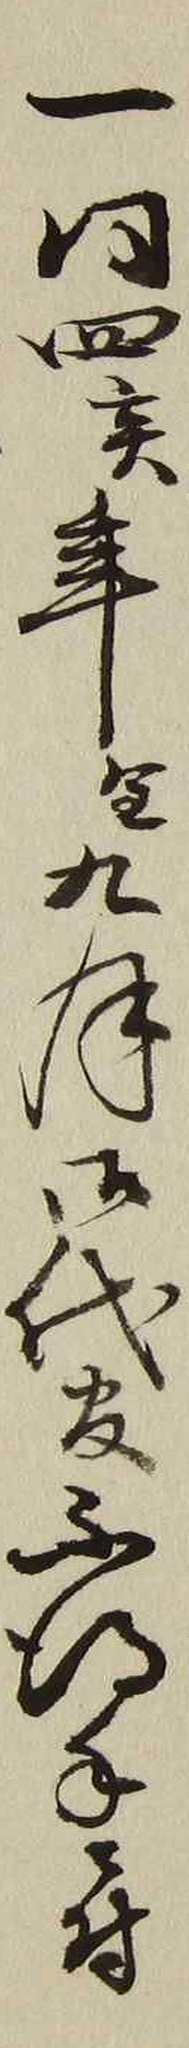一同四亥年閏九月御代官不得手ニ付
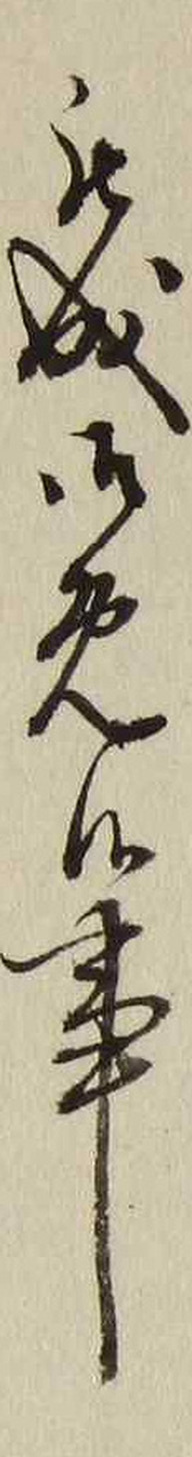被成御免候事
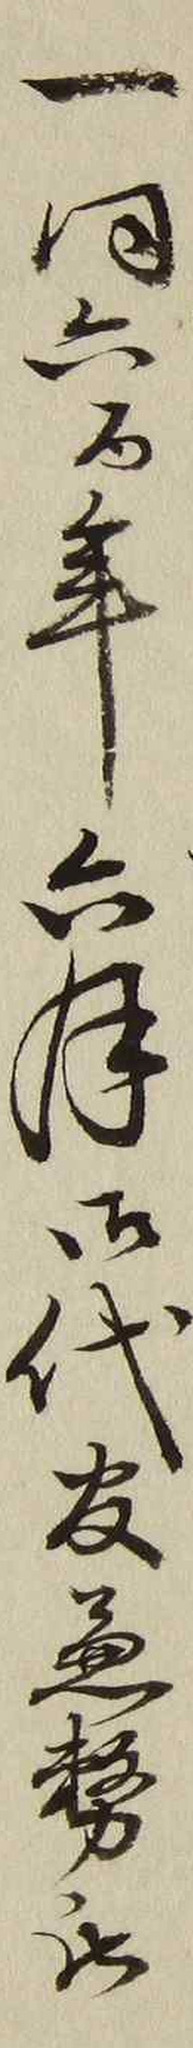一同六酉年六月御代官兼務被
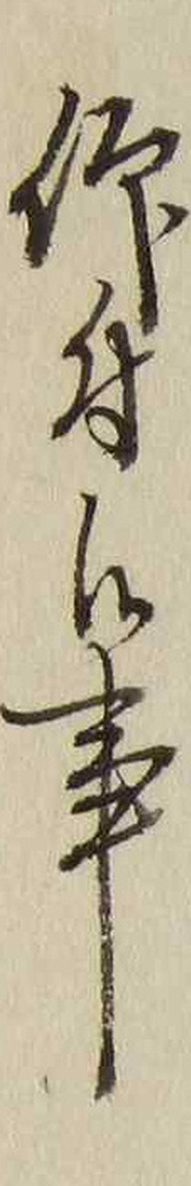仰付候事

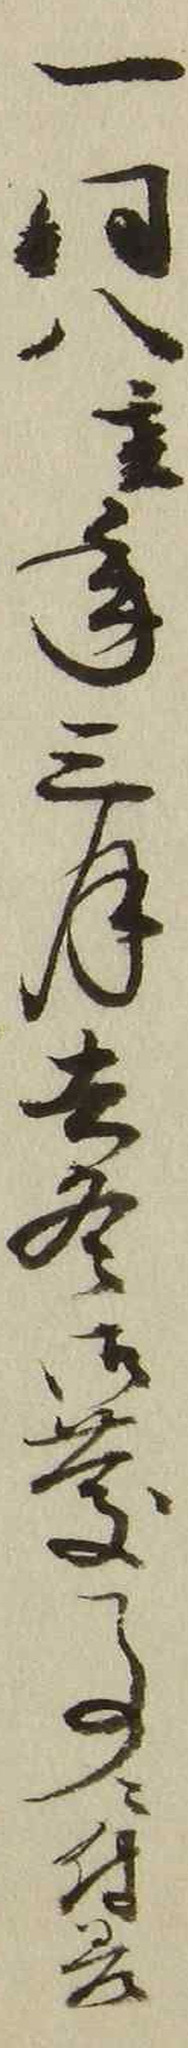一同八亥年三月去冬御慶事ニ付差
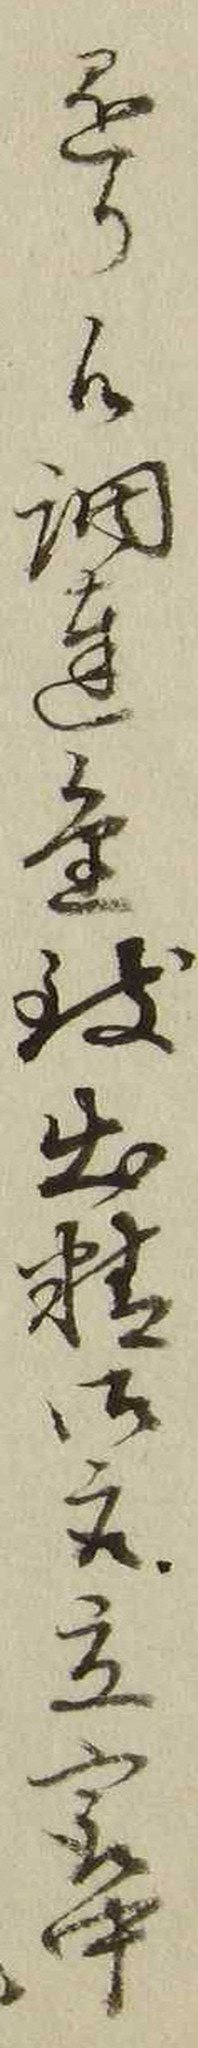懸り候調達金致出精御取立最中
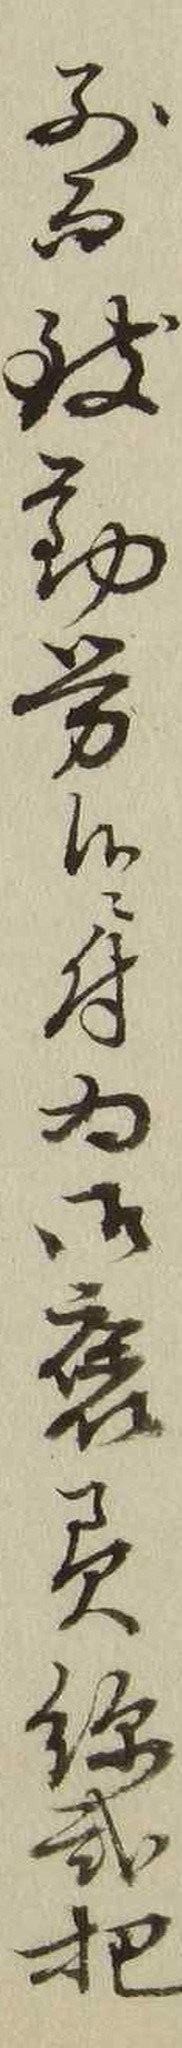別而致勤労候ニ付為御褒美綿弐把
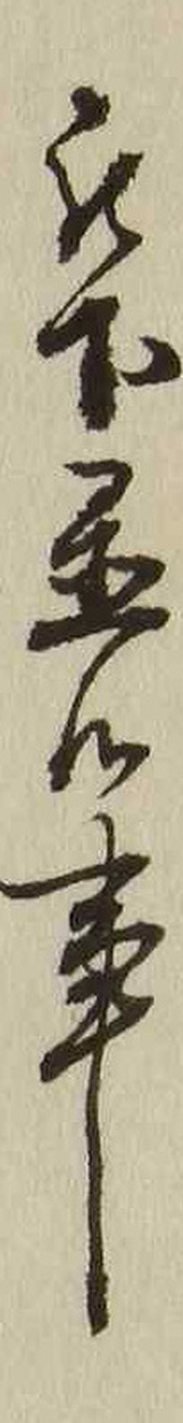被下置候事
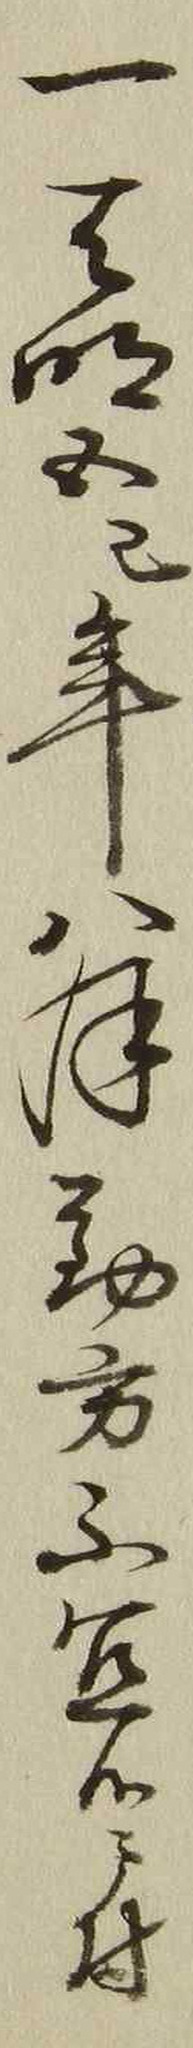一天明五巳年八月勤方不宜候ニ付
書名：諸士系譜　巻之36　は之部4
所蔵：会津若松市立会津図書館
